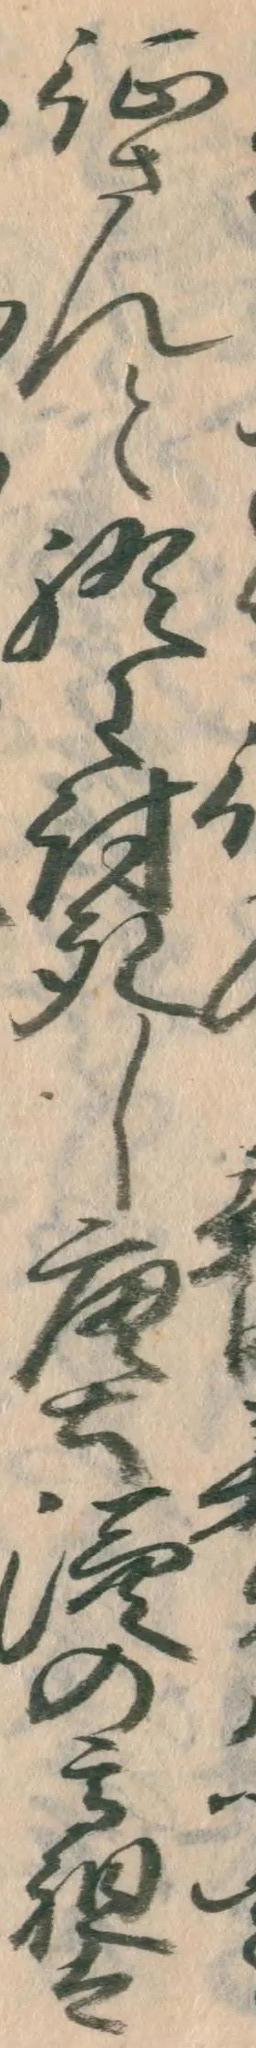征さんと終に討死し唐土漢の高祖は
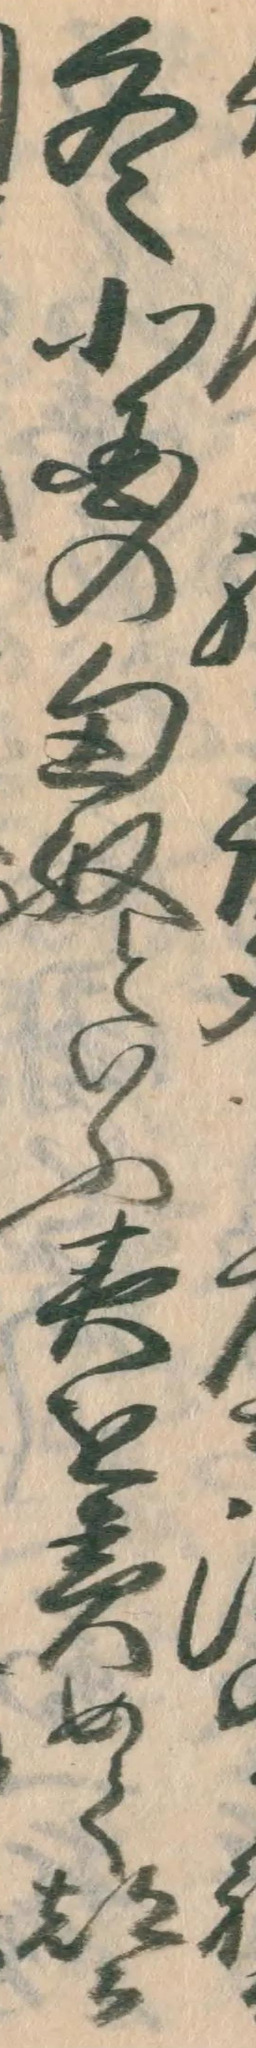冬北国の匈奴といふ夷を責めて都而
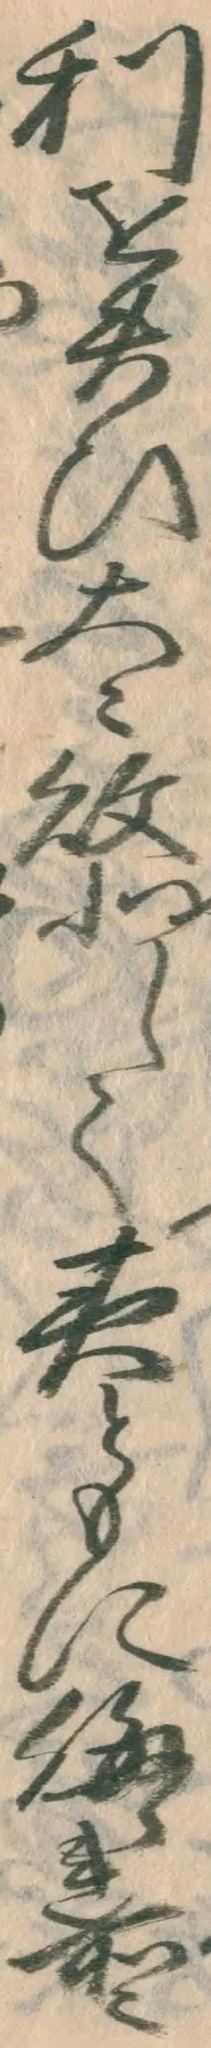利を失ひ大ニ敗北して夷ともに侮られ所々
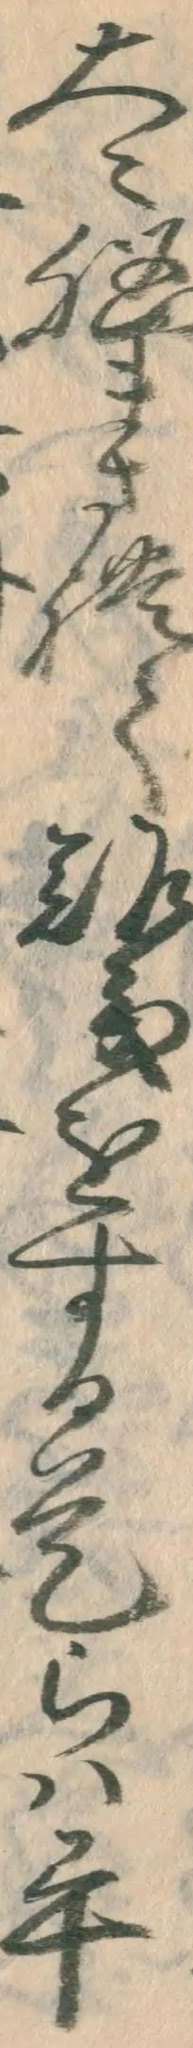大ニ悩まされて難義をする是らハ畢
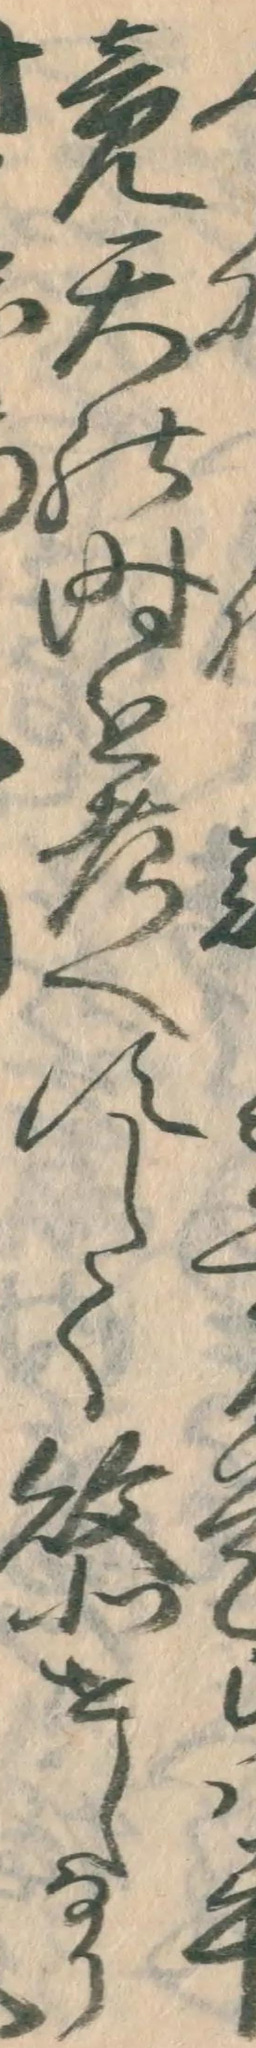竟天の時を考へすして敗北せしなり
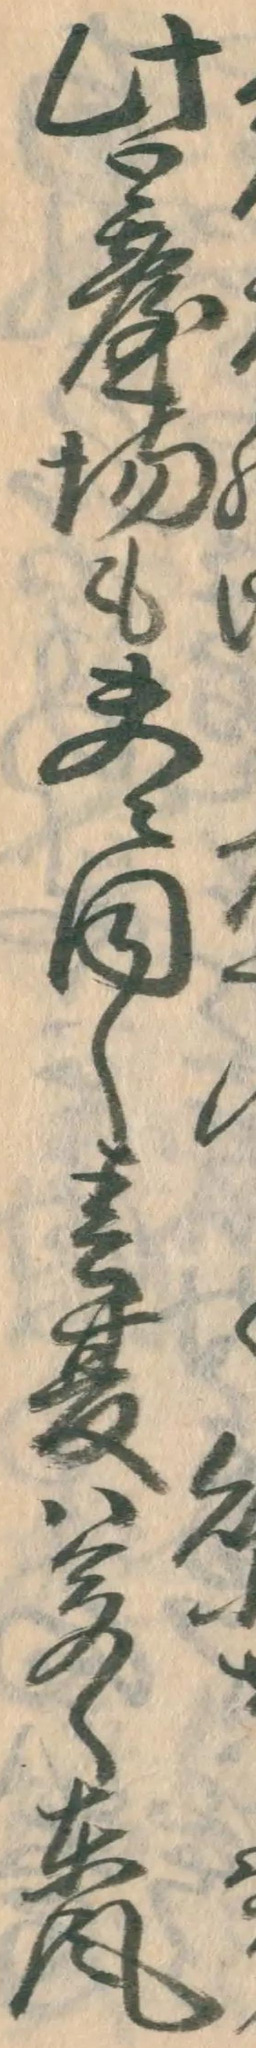此御臺場も夫々同し春秋ハ多く東風

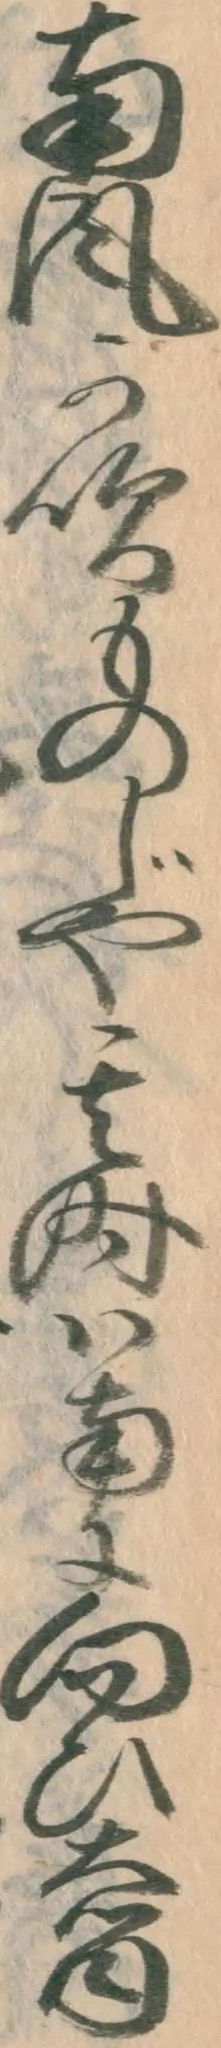南風か吹ものじや其時ハ南に向ひ大筒
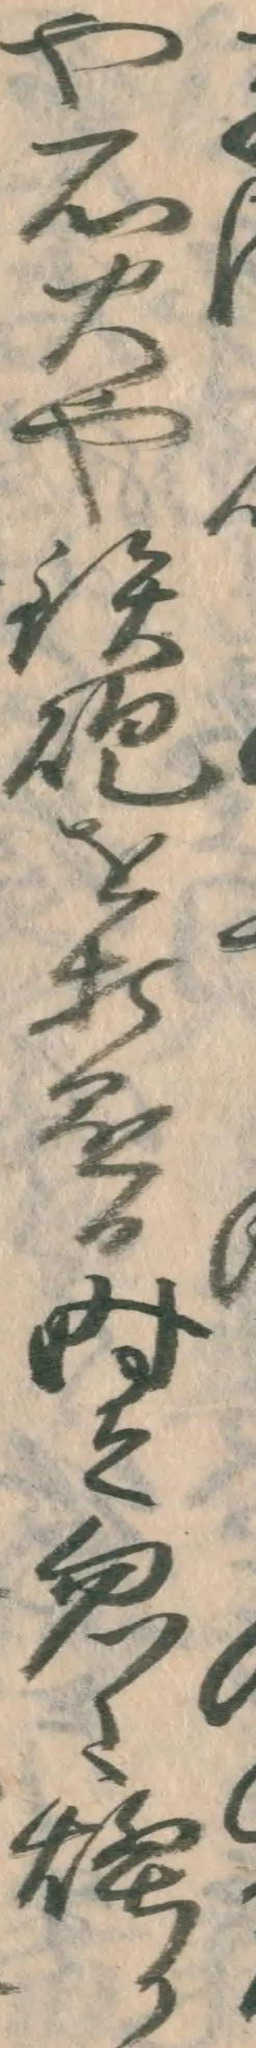や石火や鉄砲を打懸る時は忽に煙り
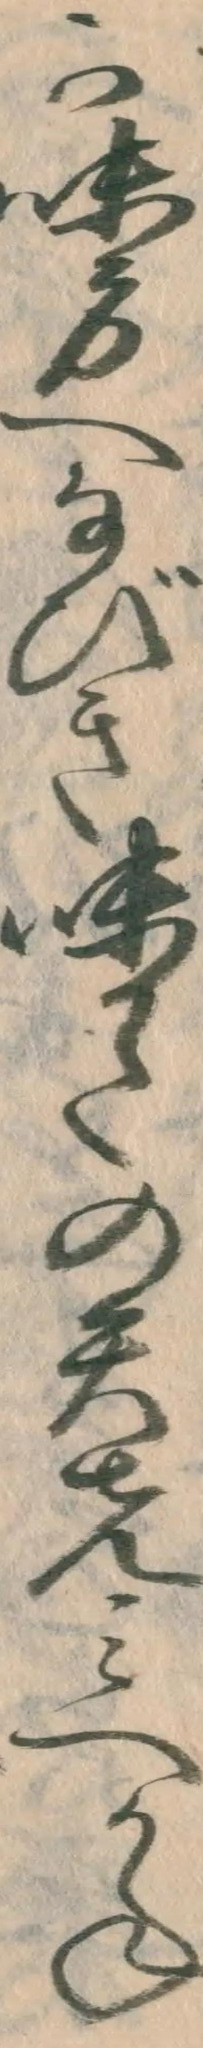か味方へなびき味かたの矢先ミへかね
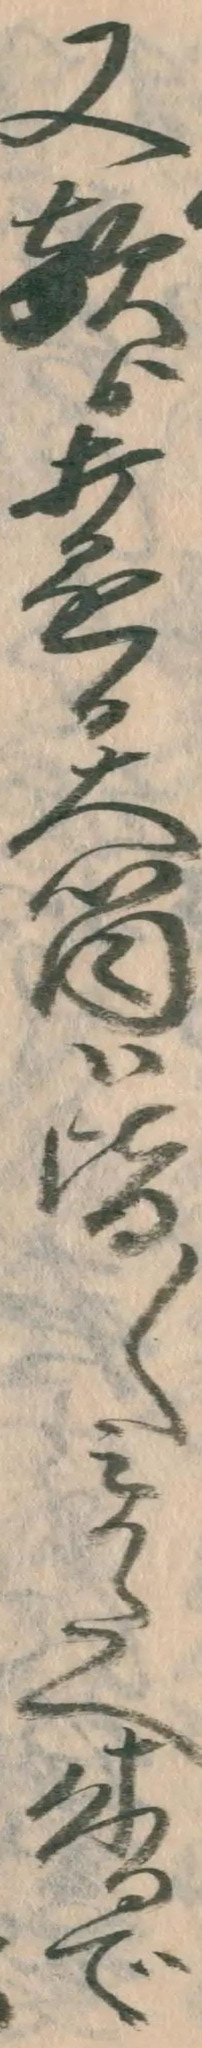又敵ゟ打懸る大筒ハ皆〳〵ミかたへ来るで
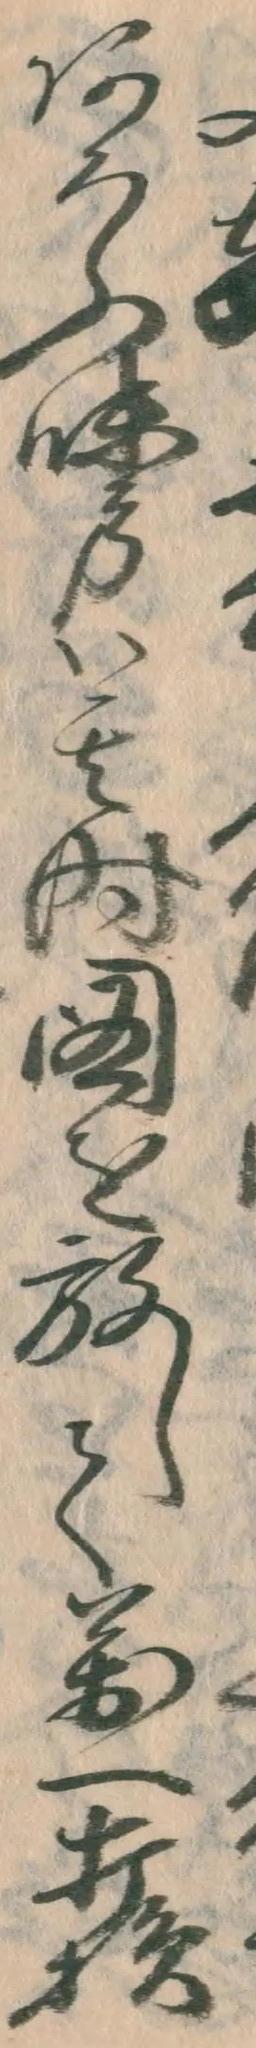あろふ味方ハ其時図を放して萬一打損
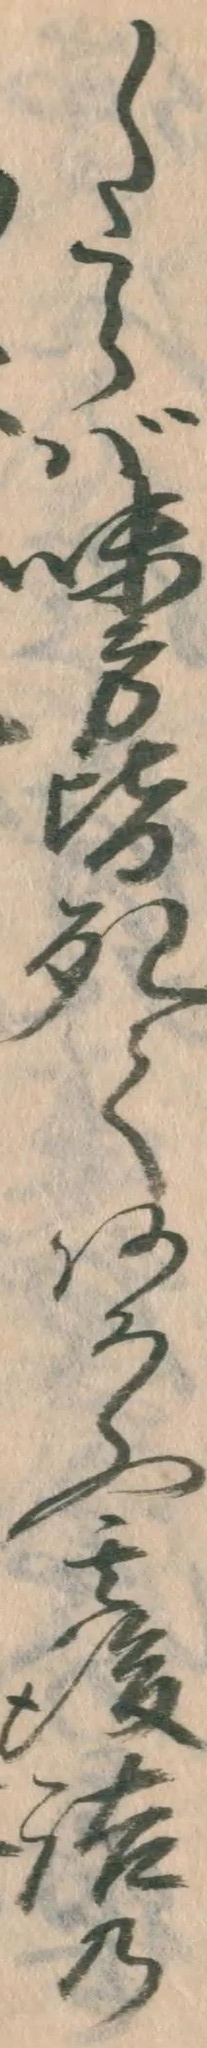したらバ味方皆死てあろふ其後詰の
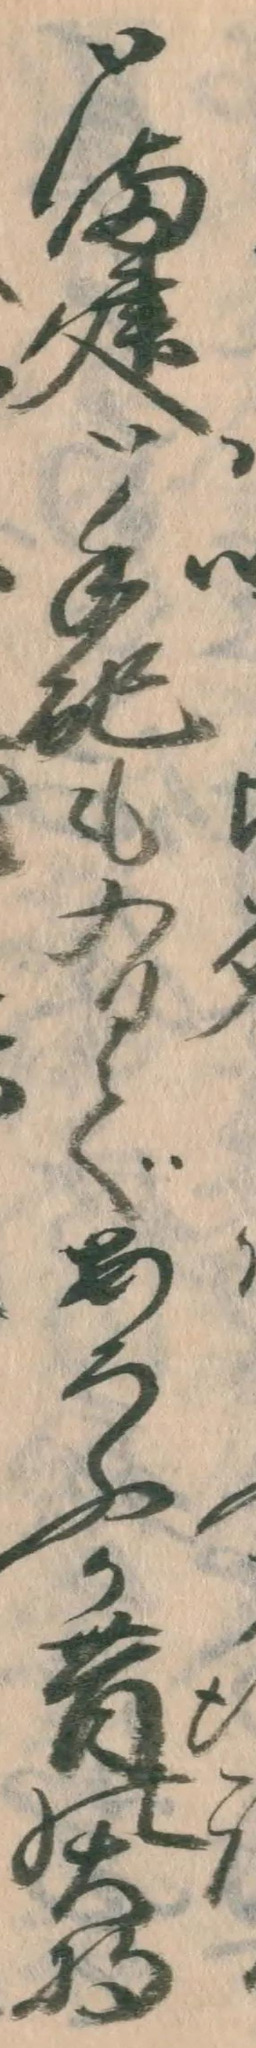御備建御手配も有であろふか昔の大将
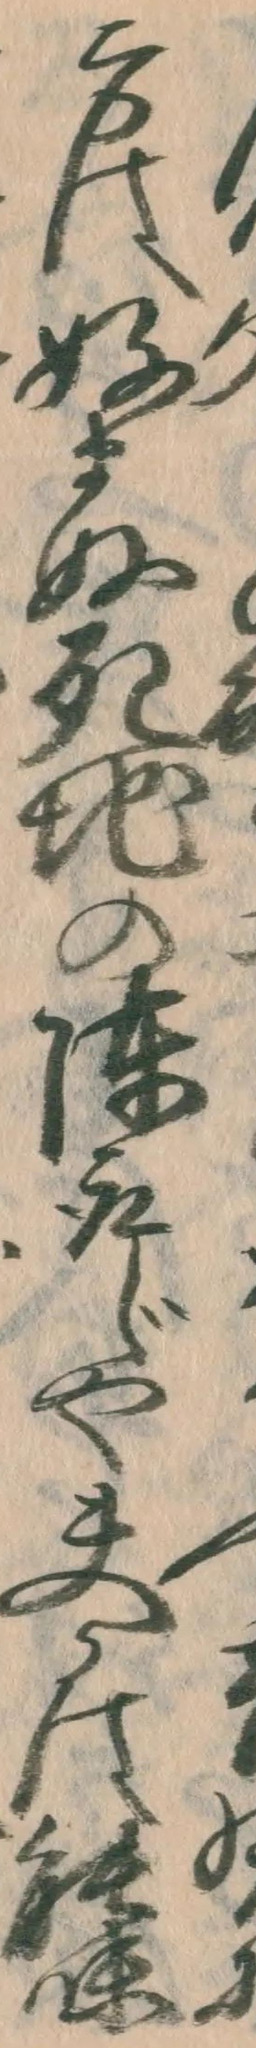方は好まぬ死地の陣取じや夫には能味
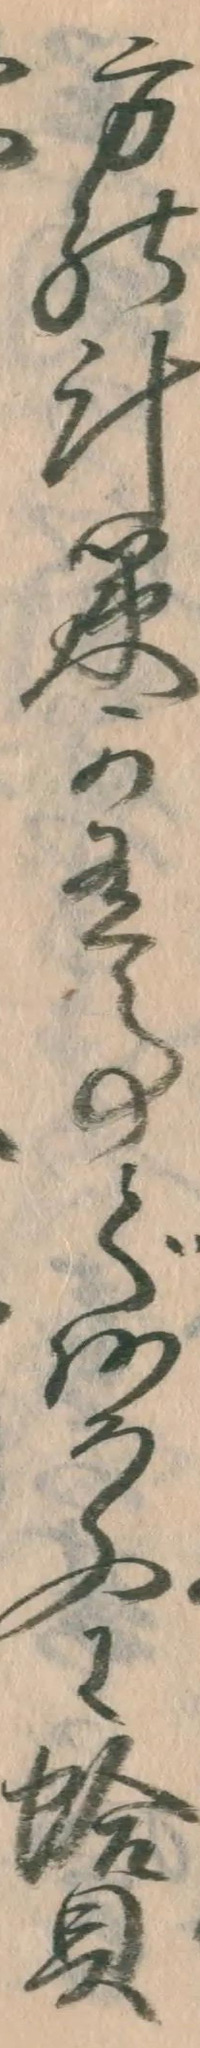方の計策か有事であろふに蛤貝
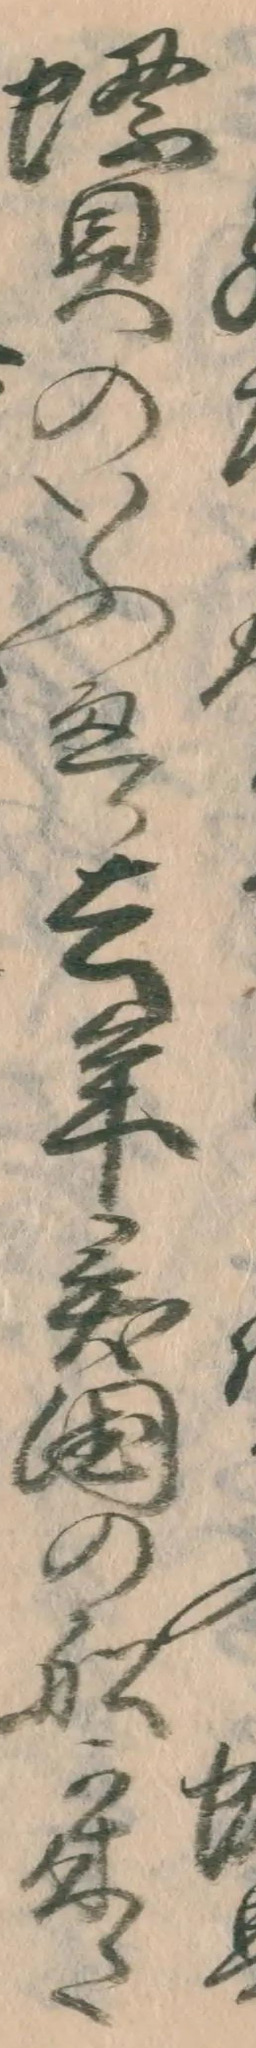螺貝のいふ通り去年異国の船か来た
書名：麗斎叢書. 20
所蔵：国立国会図書館 National Diet Library, JAPAN
